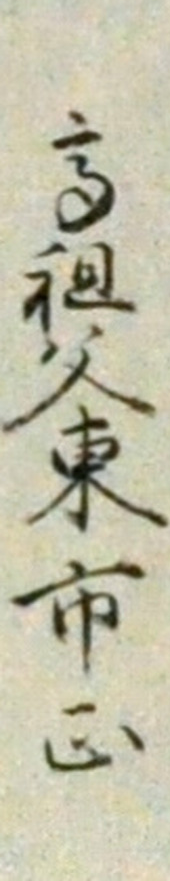高祖父東市正
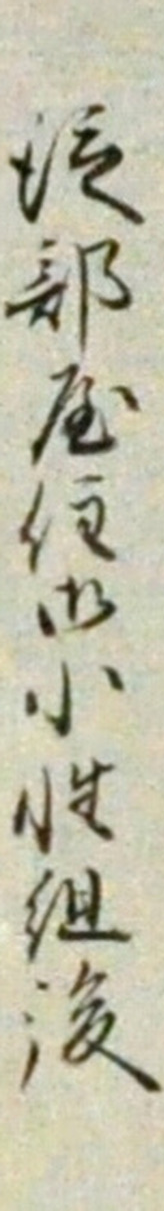従部屋住御小姓組後
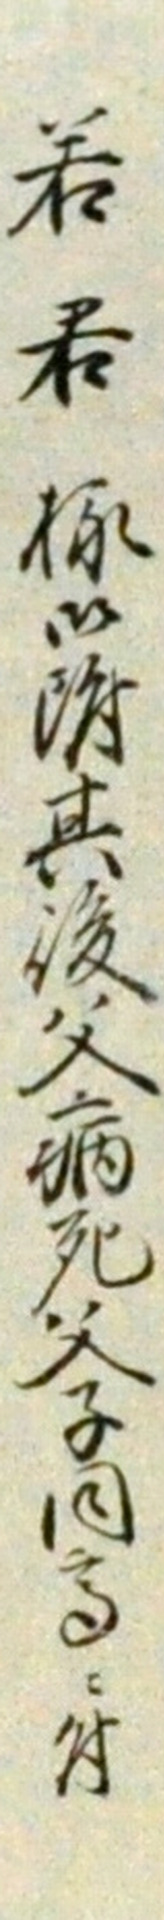若君様御附其後父病死父子同高ニ付
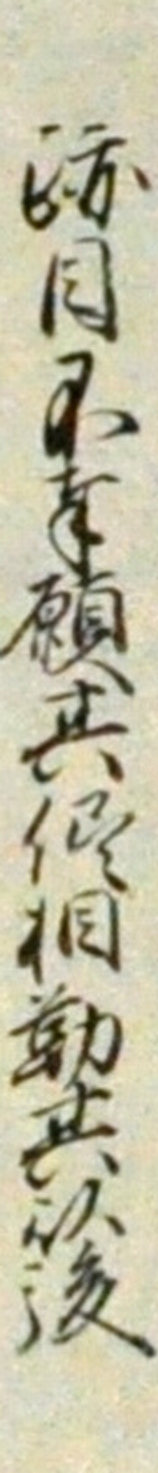跡目不奉願其侭相勤其以後
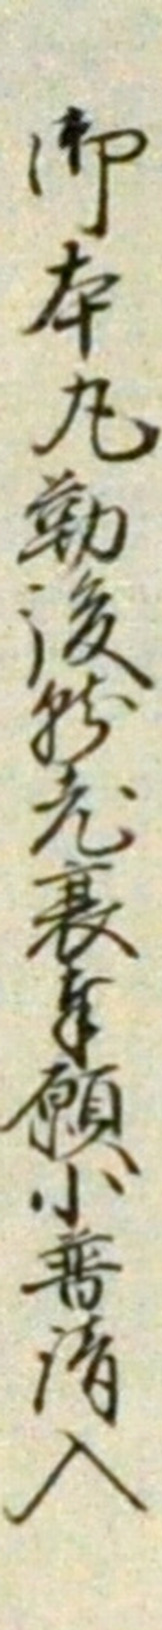御本丸勤後就老衰奉願小普請入
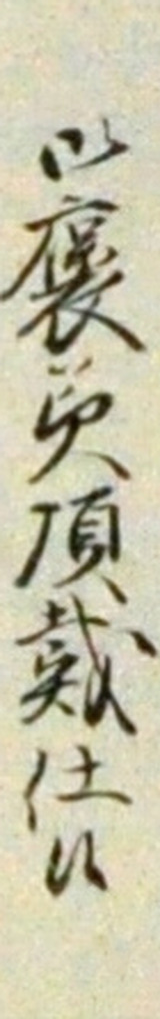御褒美頂戴仕候
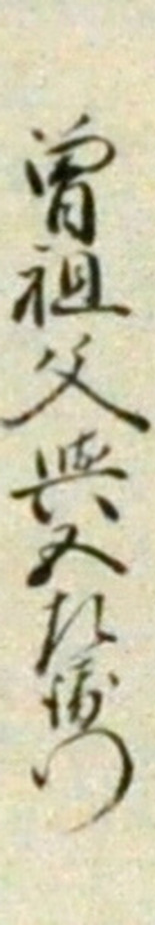曾祖父與五左衛門
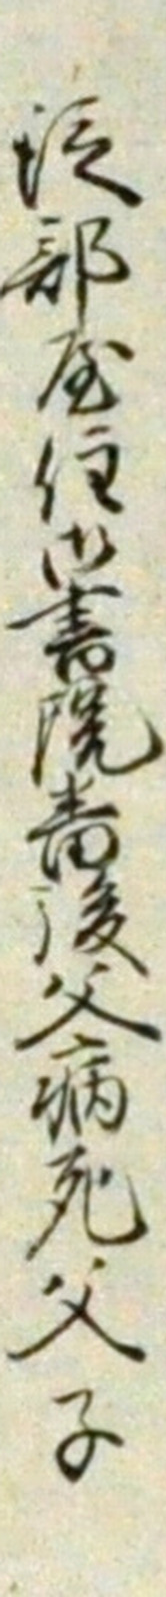従部屋住御書院番後父病死父子
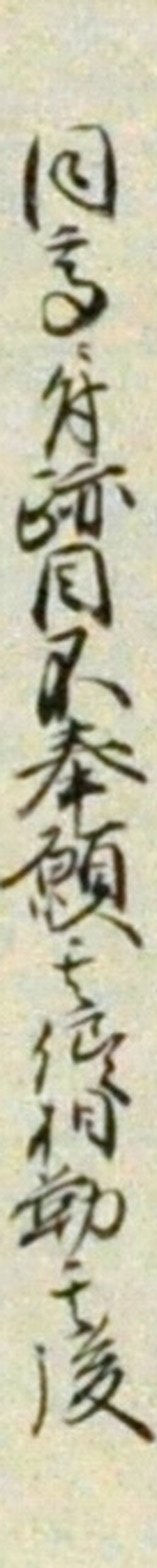同高ニ付跡目不奉願其侭相勤其後
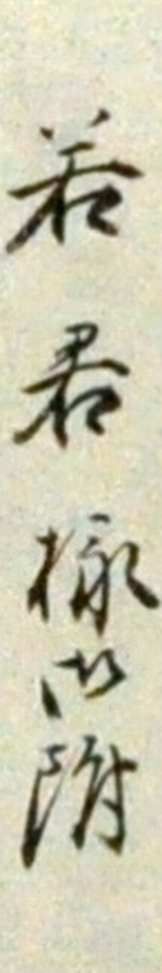若君様御附
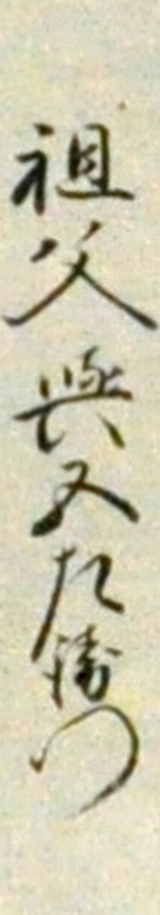祖父與五左衛門
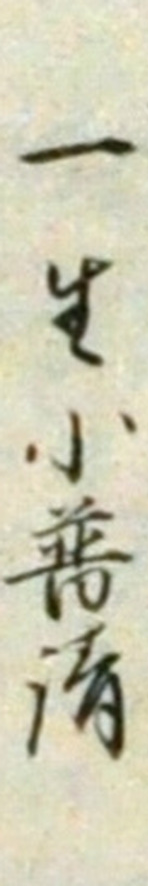一生小普請
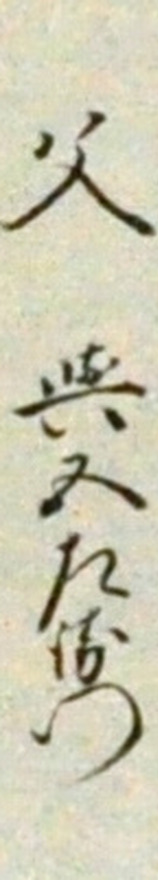父與五左衛門
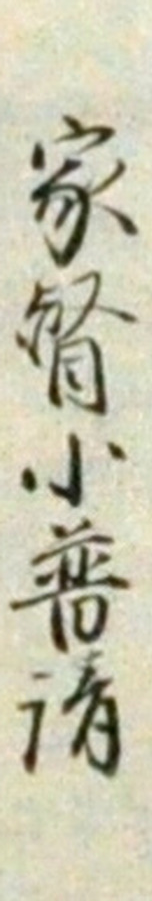家督小普請
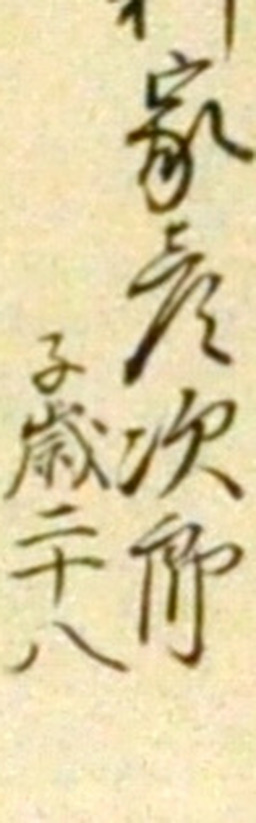子歳二十八
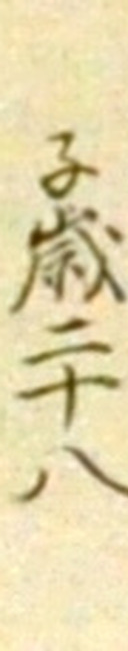子歳二十八
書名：若年寄御役中御調書付
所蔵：伊那市立高遠町図書館・合同会社AMANE
